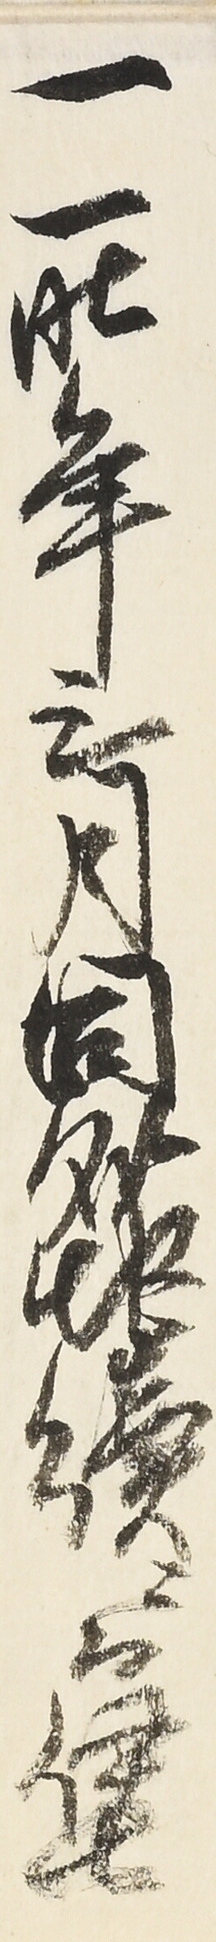一昨年三月同処地続ニ而伊七
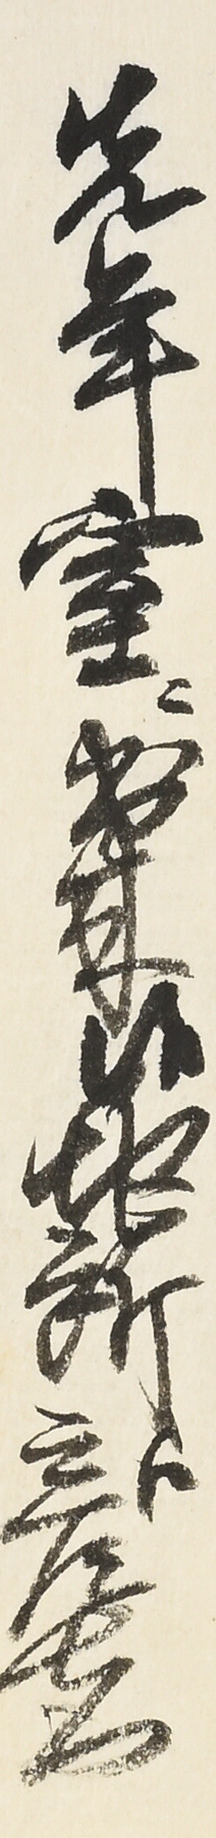先年室ニ出来候地所江彦右衛門
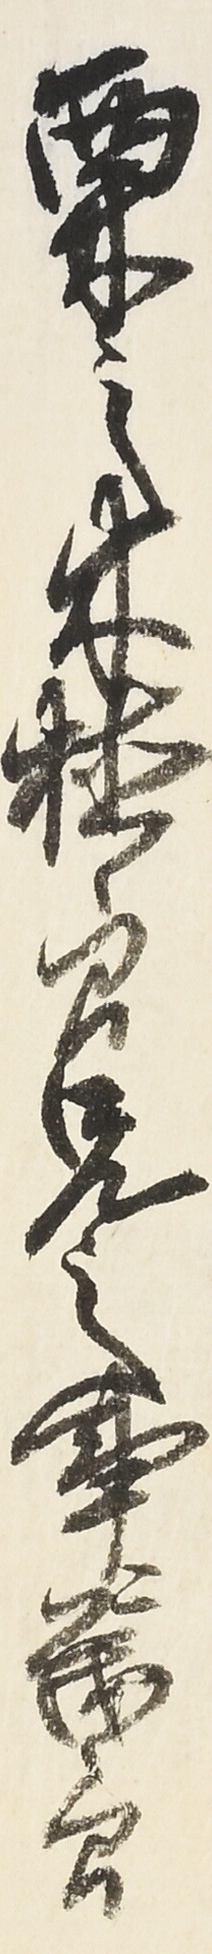栗ノ木植候間兄之事ニ茂候間
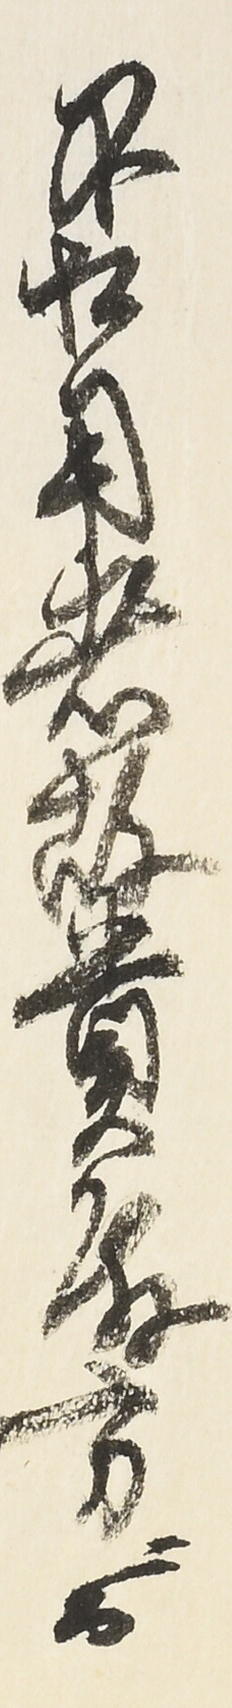不相用者故貴殿方ニ而
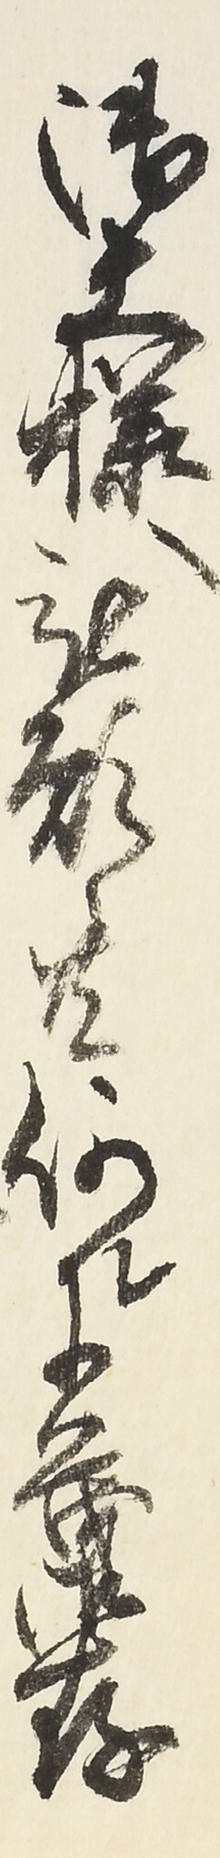御上様へ被願候共何レに茂御存
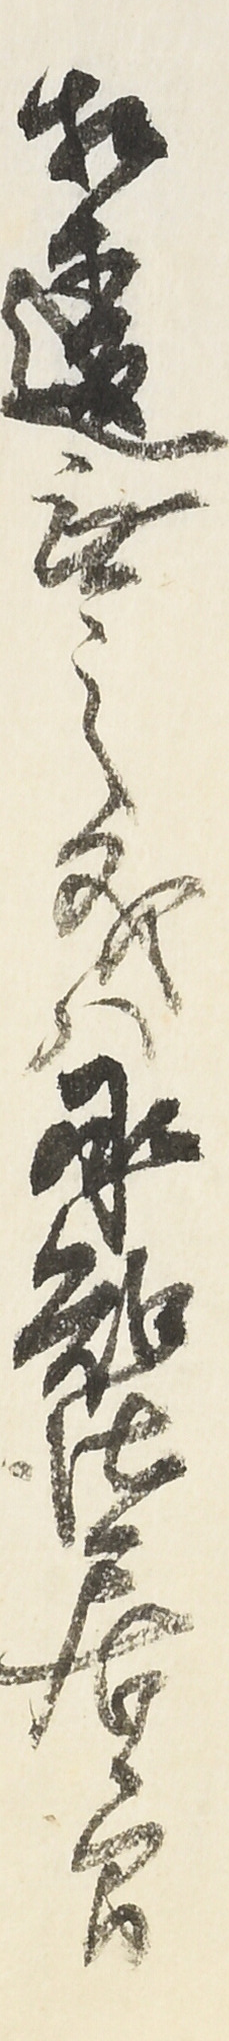相違無之義ハ承知仕居候間
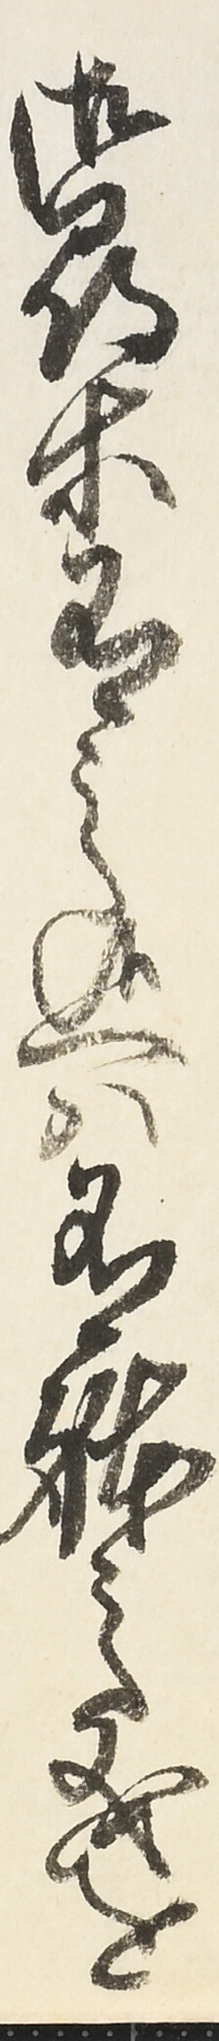御尋等有之候へハ有躰之義を
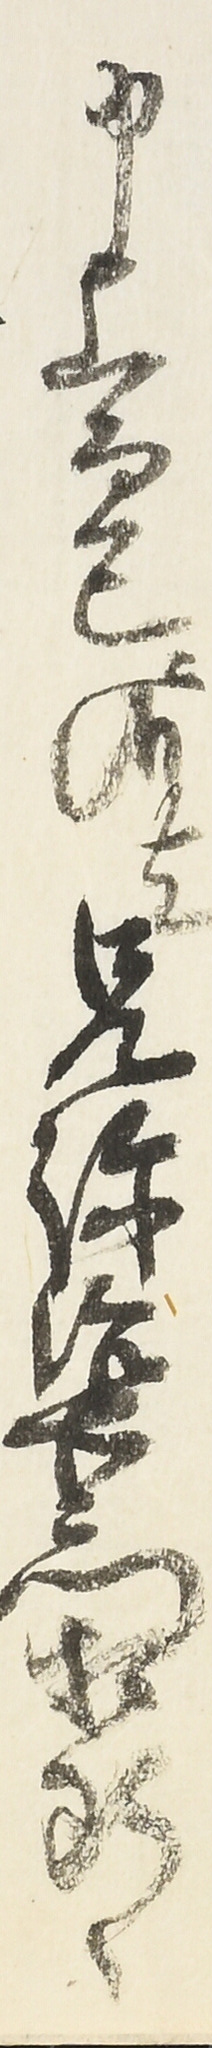申上而已ニ候与兄弥治右衛門相断候
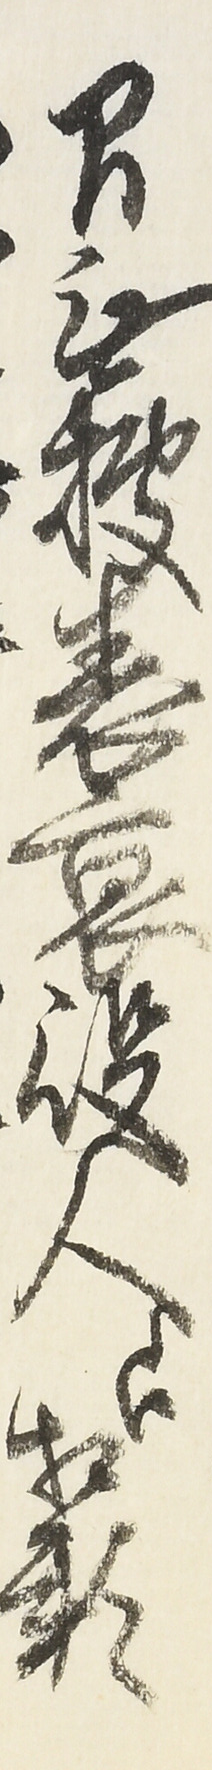間無拠表裏役人江御頼
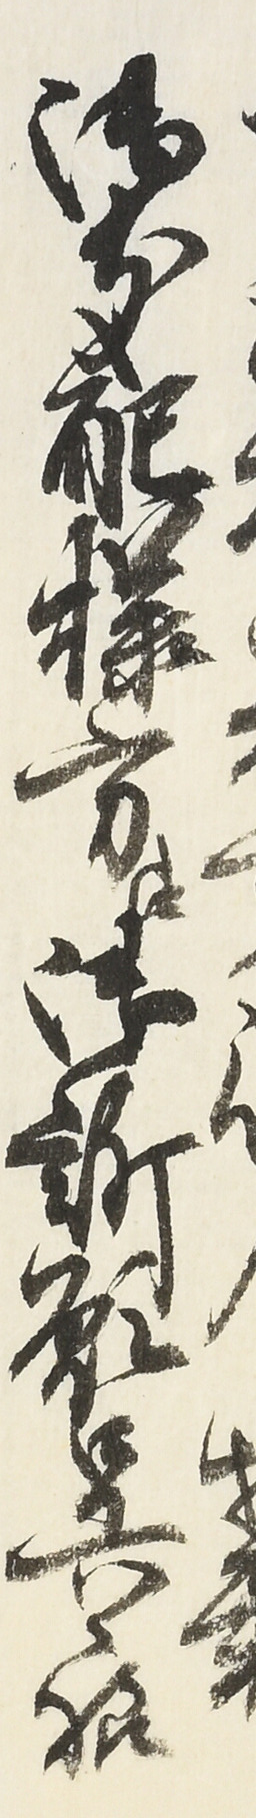御支配様方江御訴願呉候様
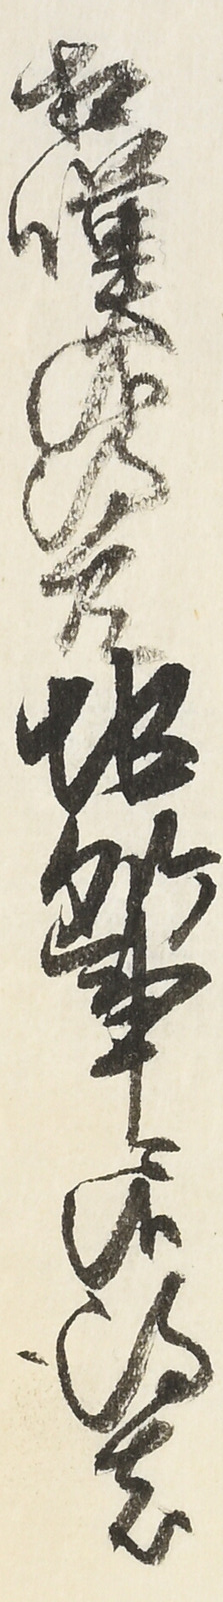相嘆候得共地処事ニ候得者

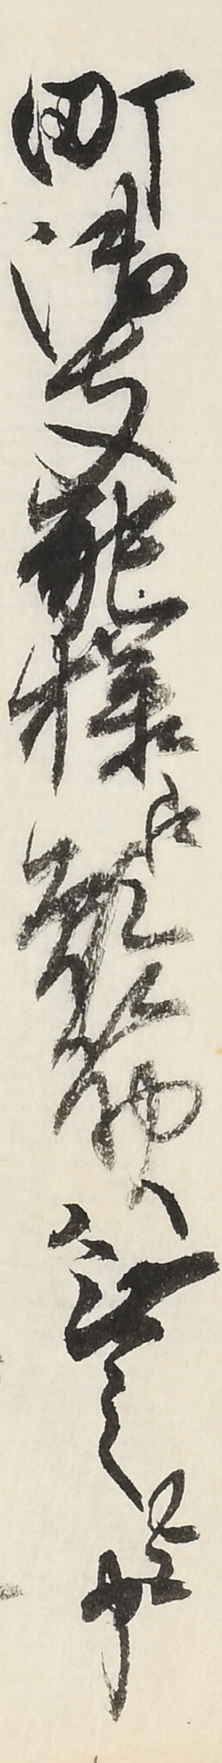町御支配様江願筋ハ無之与申
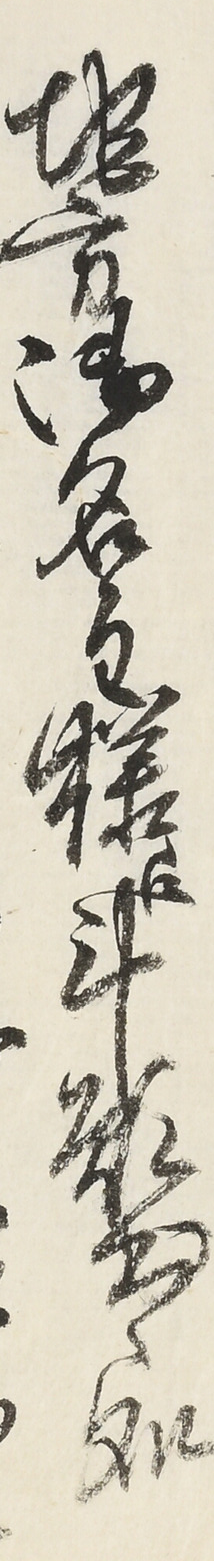地方御名主様江斗願出候処
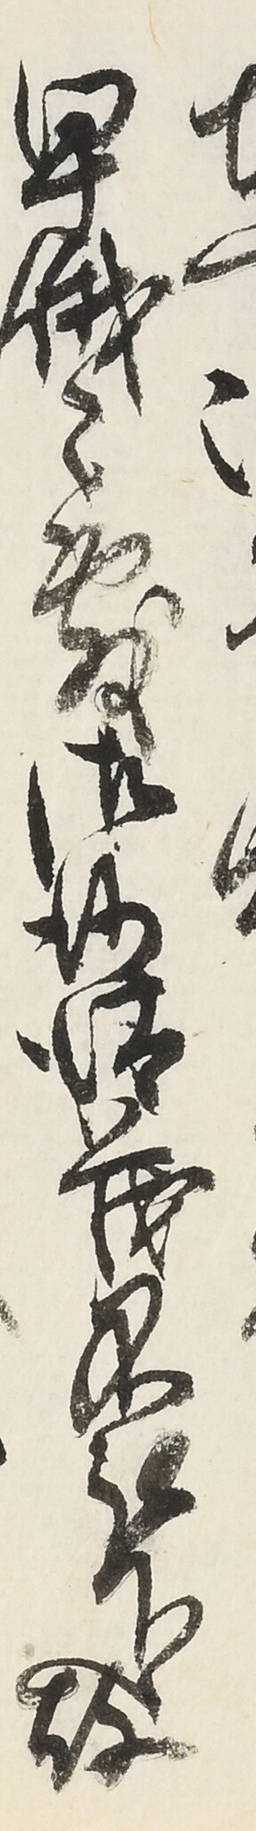早俄々敷御沙汰茂不被下候故
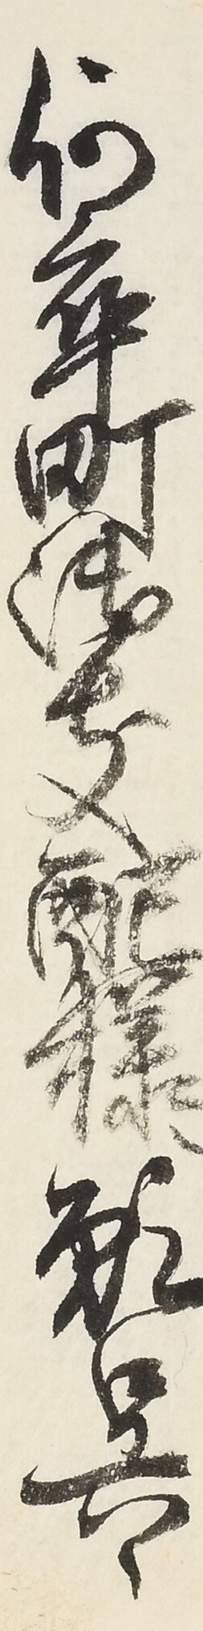何卒町御支配様へ願呉候
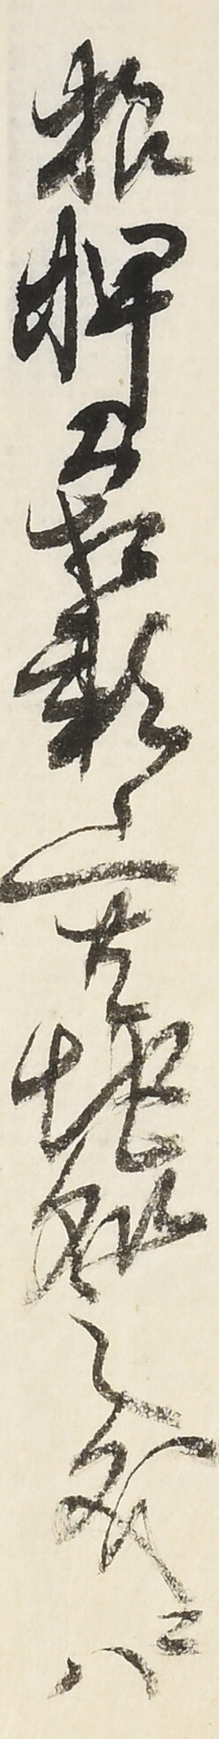様押而相頼候へ共地処之義ニハ
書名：乍恐御内々子委奉申上度口上書
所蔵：伊那市立高遠町図書館・合同会社AMANE
